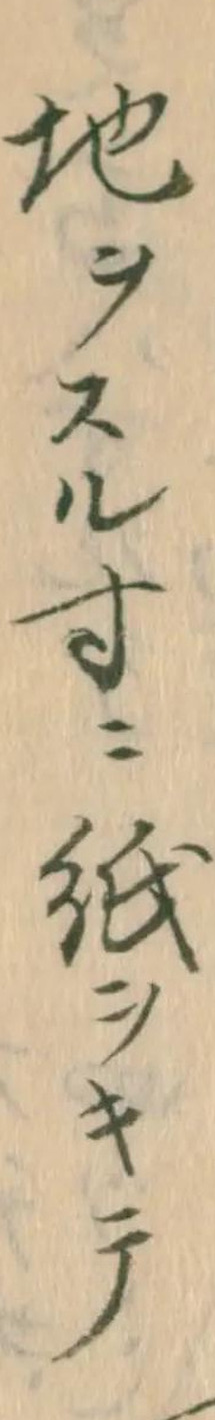地ヲスル寸ニ紙ヲキテ
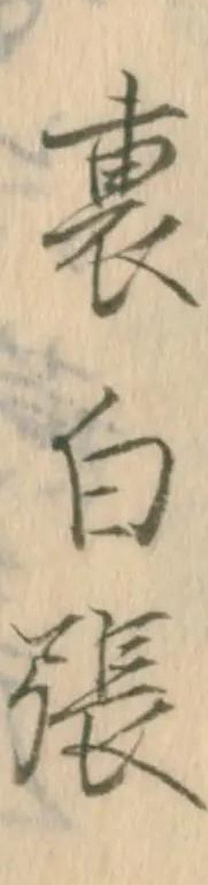裏白張
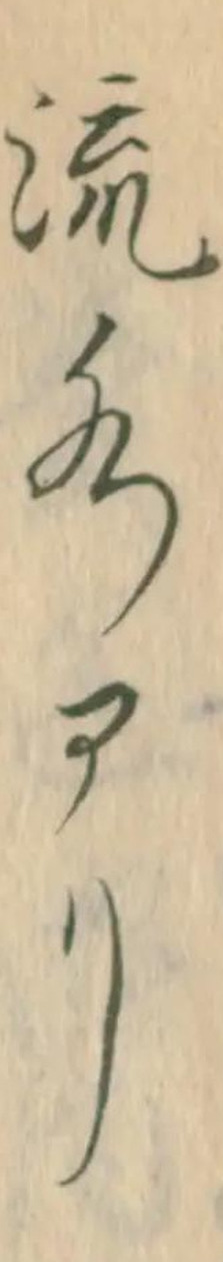流水アリ
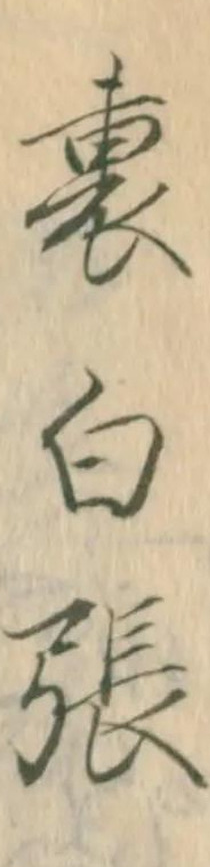裏白張

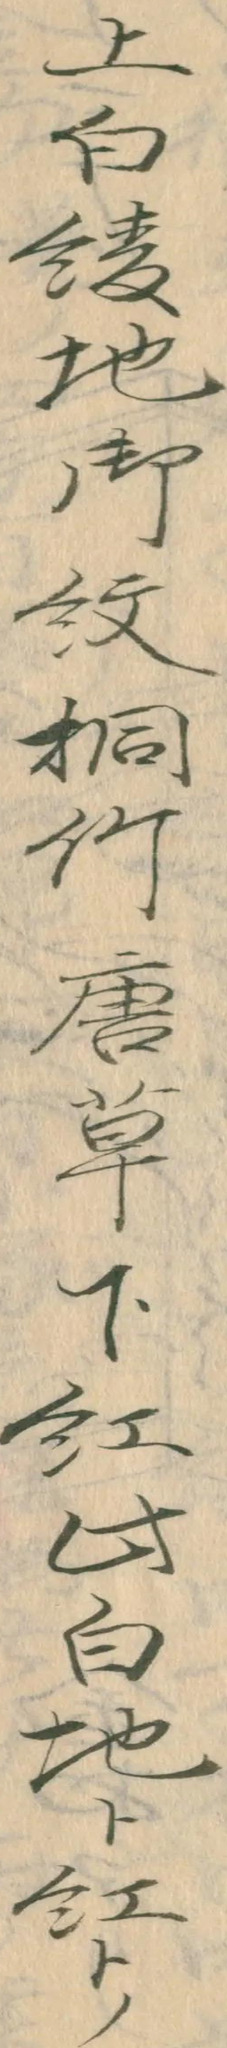上白綾地御紋桐竹唐草下紅此白地ト紅トノ
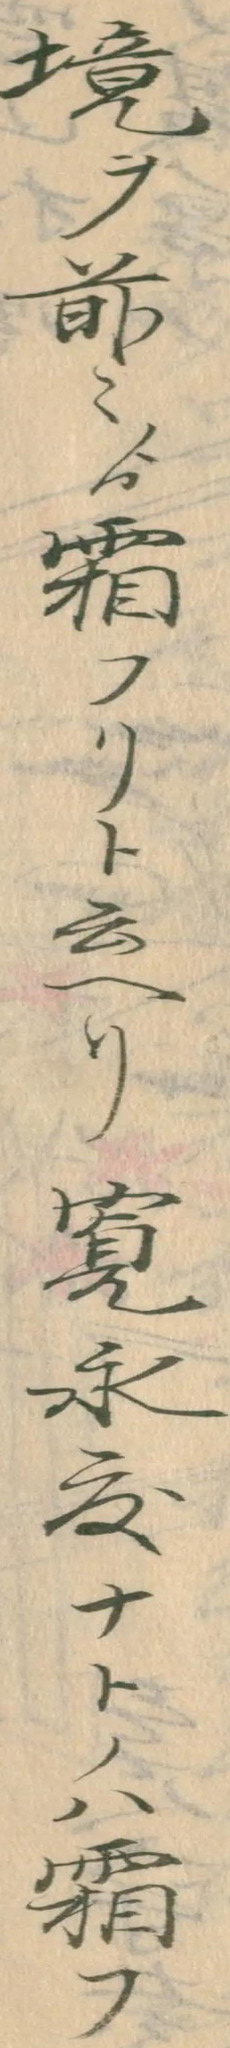境ヲ前々ゟ霜フリト云ヘリ寛永度ナトノハ霜フ
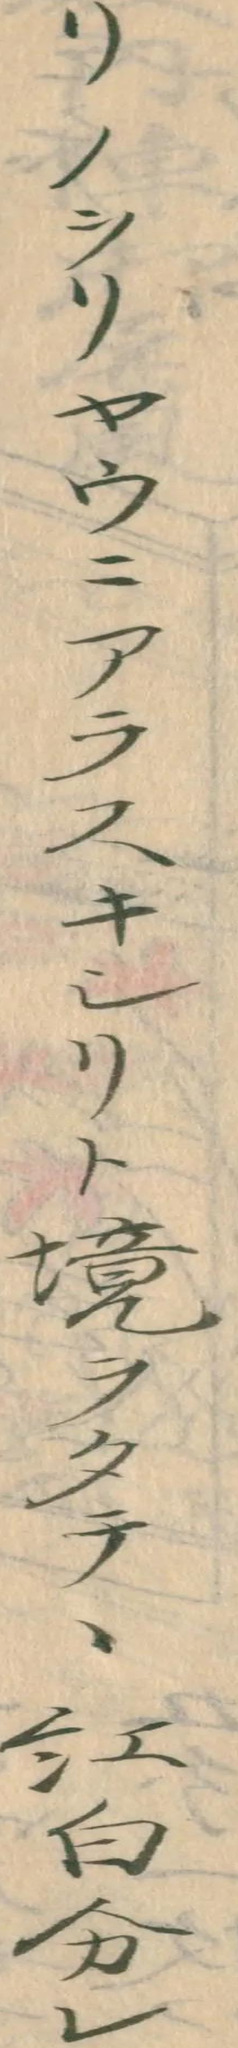リノヲリヤウニアラスキシリト境ヲタテヽ紅白分レ
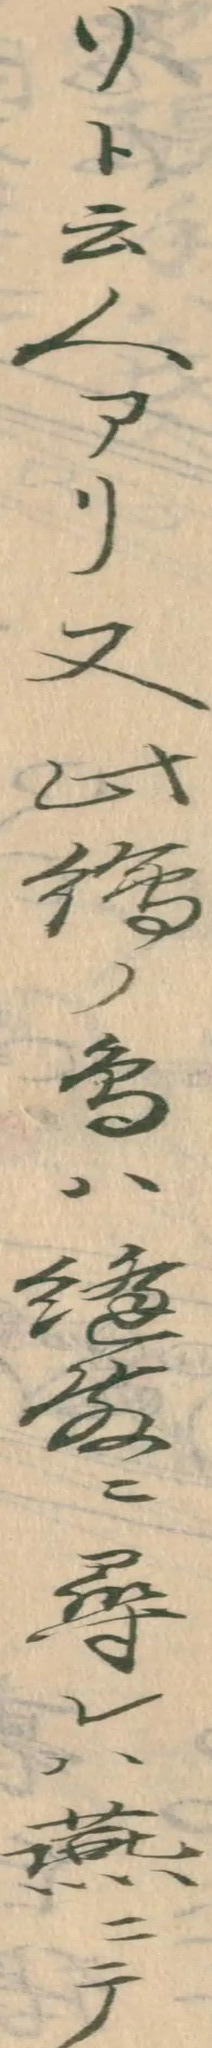リト云人アリ又此絵ノ鳥ハ縫殿ニ尋レハ燕ニテ
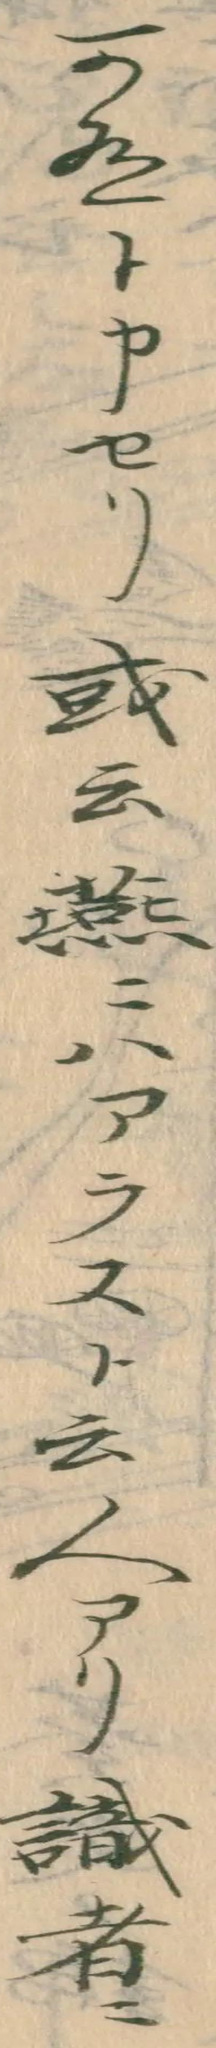可有ト申セリ或云燕ニハアラスト云人アリ識者ニ
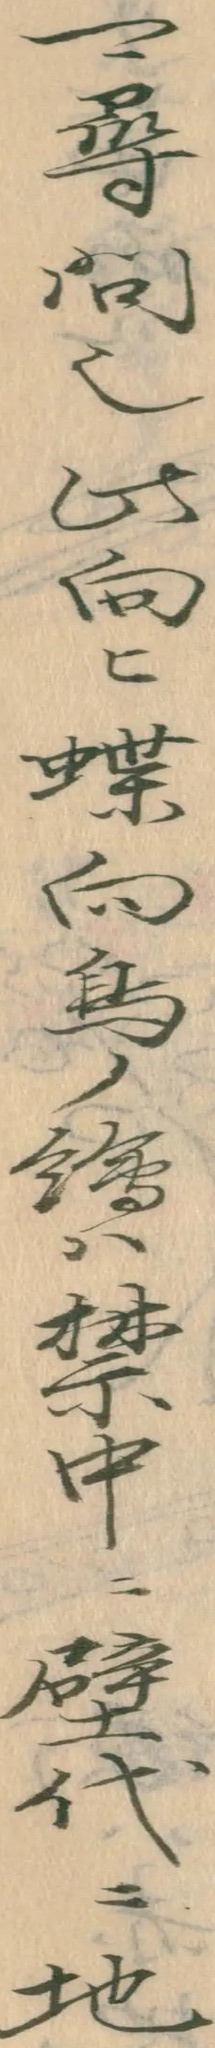可尋問也此向ヒ蝶向鳥ノ絵ハ禁中ニ壁代ニ地
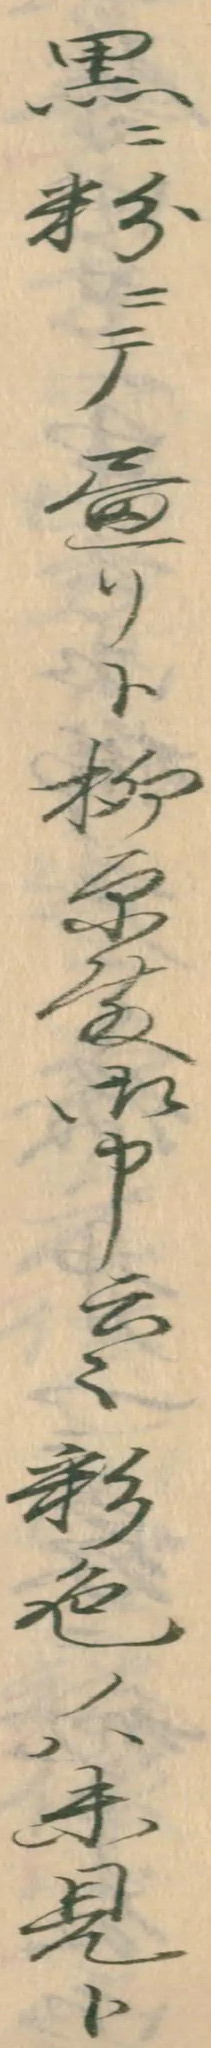黒ニ粉ニテ尽リト柳原殿御申云々彩色ノハ未見ト
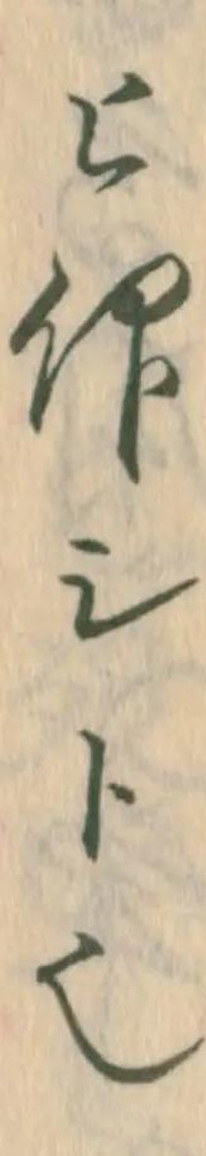被仰シト也
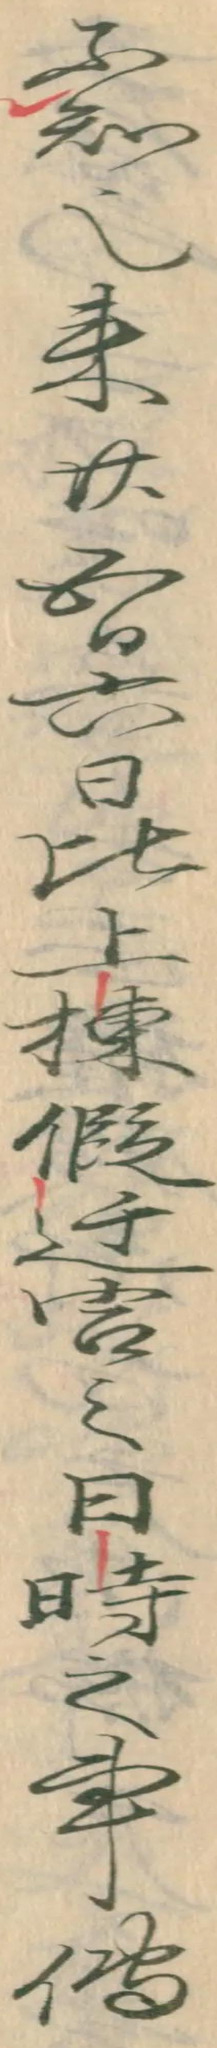不知也来廿五日六日比上-棟仮_迁宮之日-時之事伝
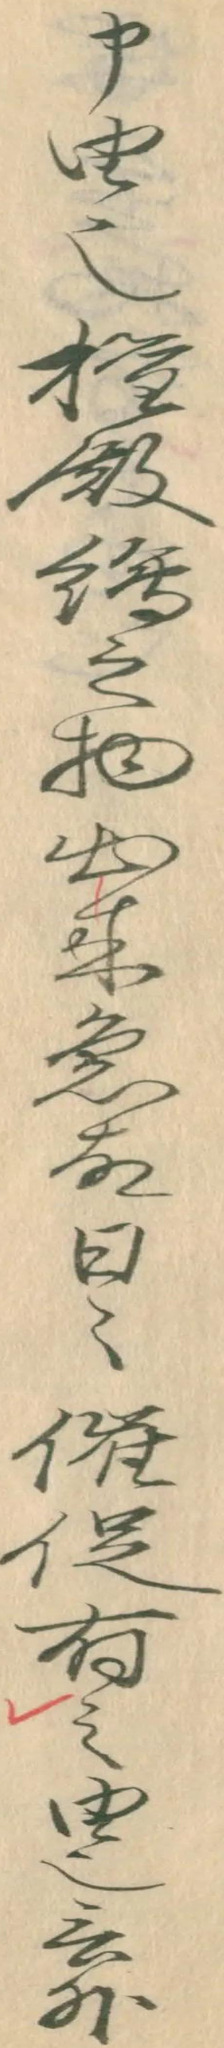申由也權殿絵之物出-来急故日々催促有之由也云外

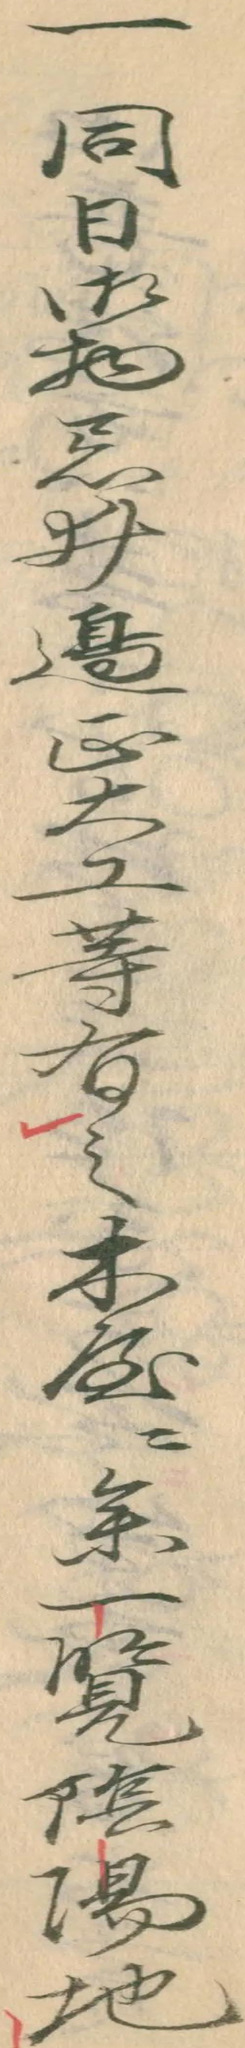一同日御物忌井辺正大工等有之木屋二参一-覧陰-陽地_
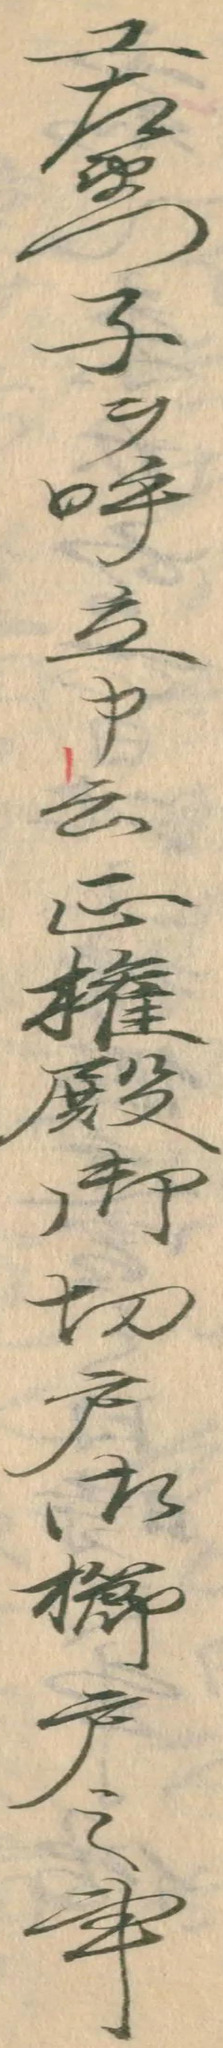工左衛門子ヲ呼立申_云正権殿御切戸御櫛戸之事
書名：賀茂社記録. 第15冊
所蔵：国立国会図書館 National Diet Library, JAPAN
